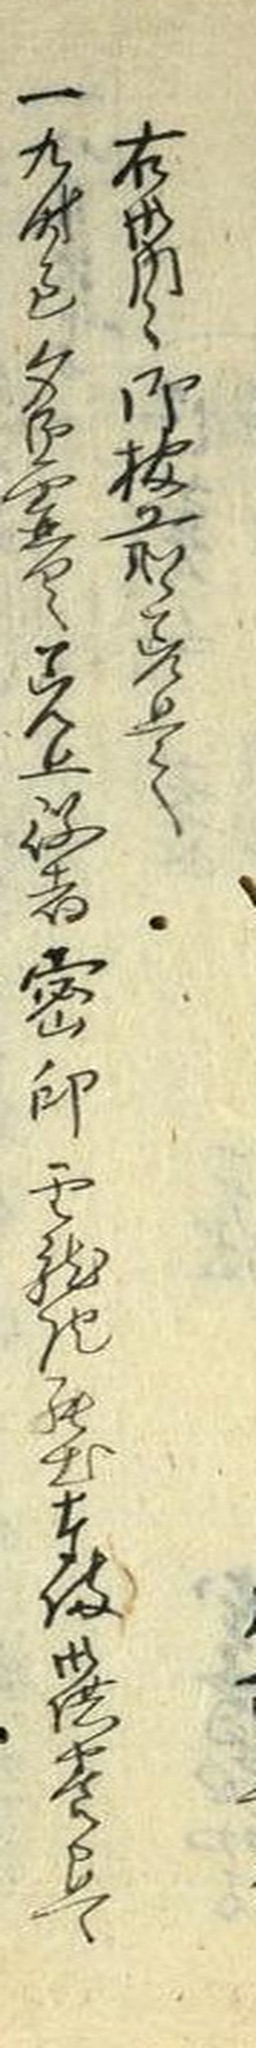一九時過夕御霊具差上役者密印雲龍院罷出奉備御供養申上候
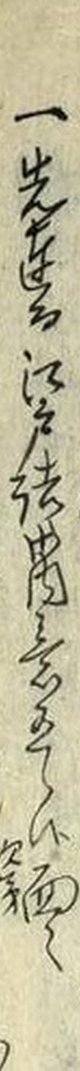一先達而江戸詰御内意有之候面々
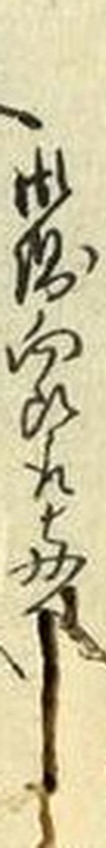御側向頭取両人
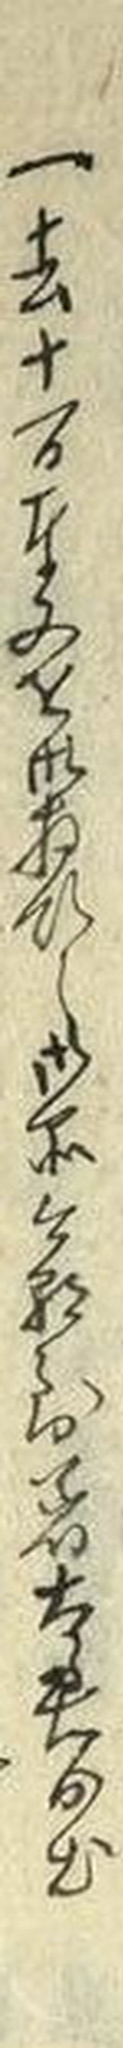一去十一日奉文を御拝領之御品今朝到着大奥ゟ出
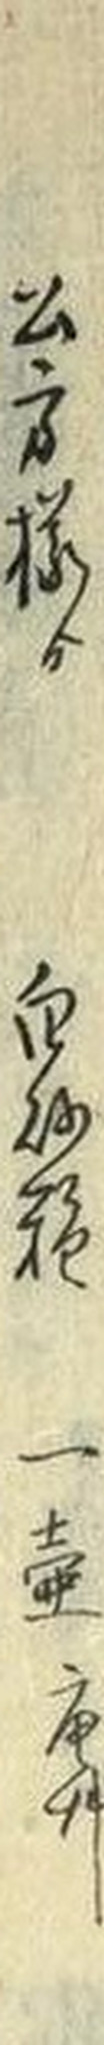公方様ゟ白砂糖一壺唐草
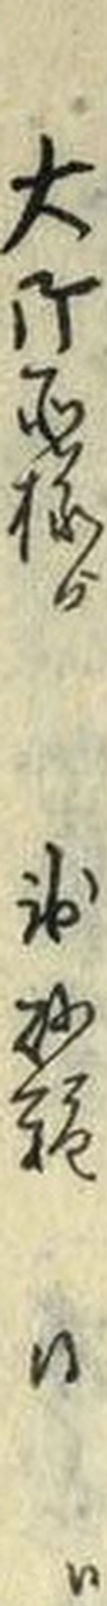大御所様ゟ氷砂糖同同
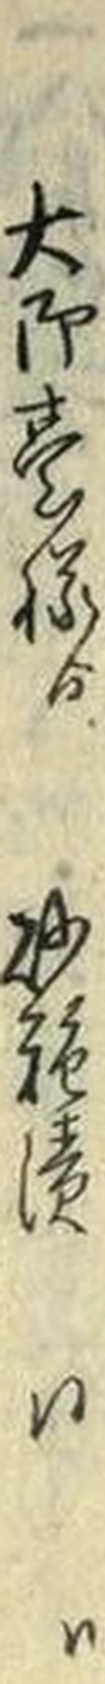大御台様ゟ砂糖漬同同
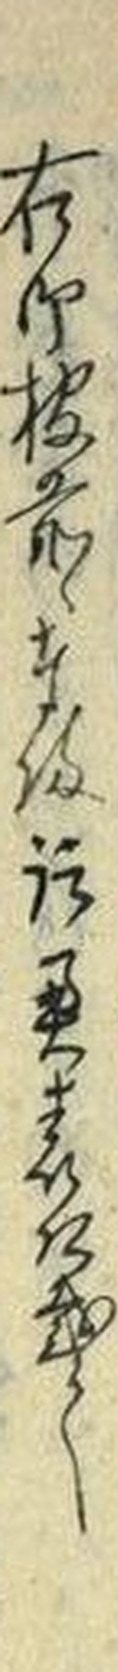右御棺前へ奉備跡奥表頂戴之
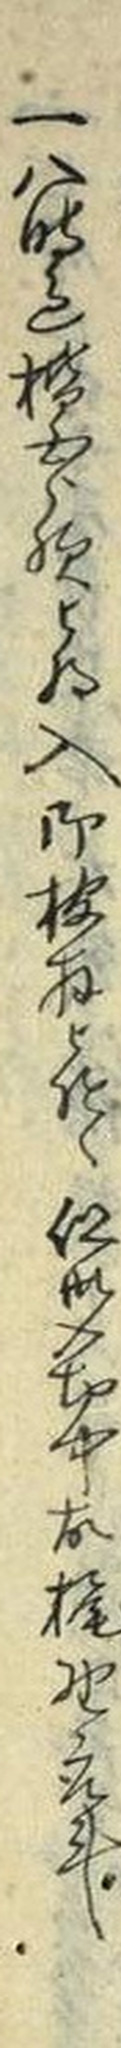一八時過楷五郎様被為入御棺拝被遊候但御〆切中故梶野取斗

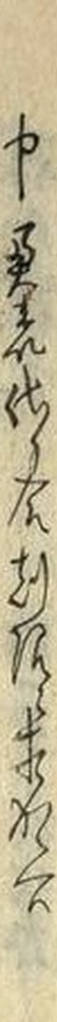中奥表代り合刻限ニ相成候へハ
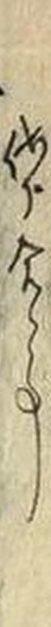代り合候事
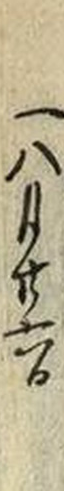一八月廿六日
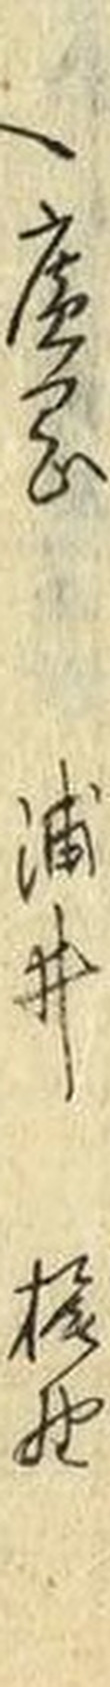広岡浦井梶野
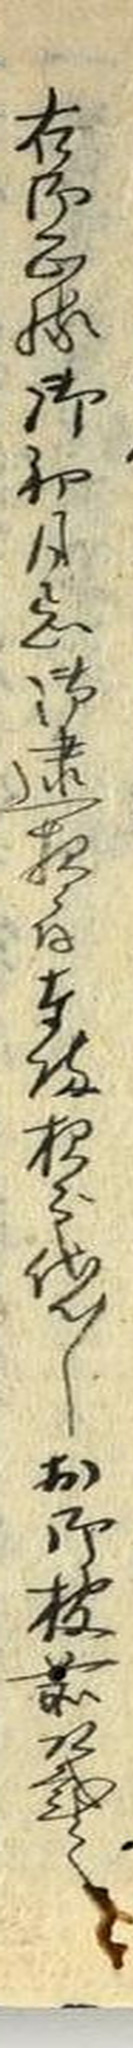右御正統御初月忌御逮夜ニ付奉備夜分代ㇽ〳〵於御棺前頂戴之
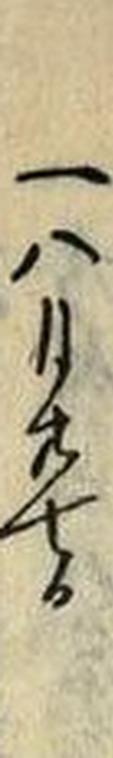一八月廿七日
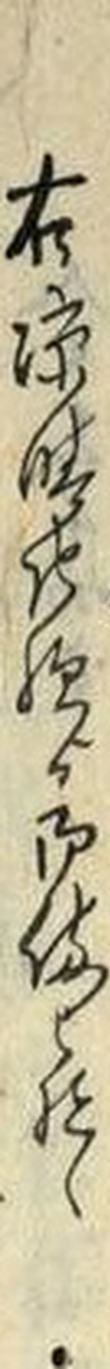右涼晴院様ゟ御備被遊候
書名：少傅日録抄（斉善付側向頭取日記、江戸并道中、初入在国、逝去後…
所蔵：福井県文書館 Fukui Prefectural Archives
